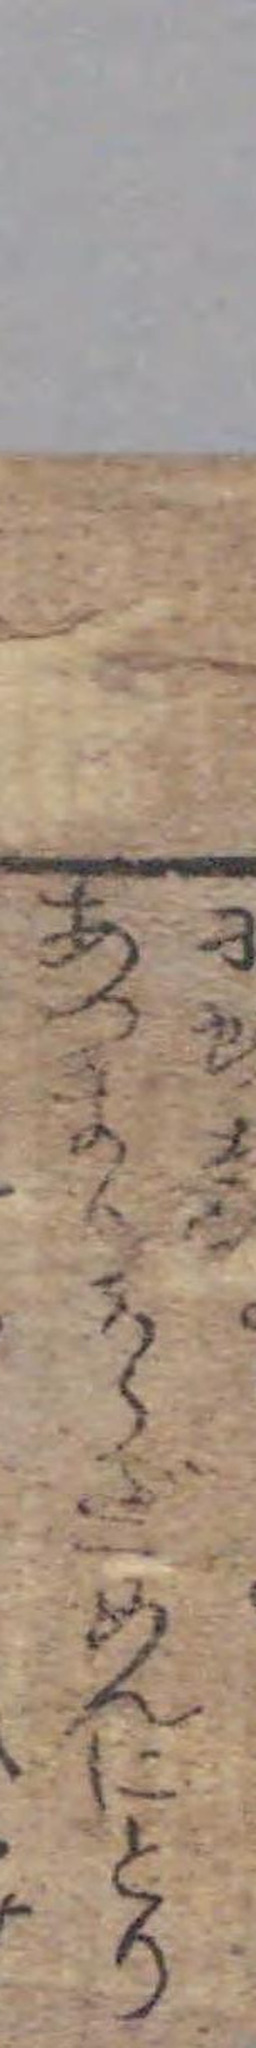あつまりからだ一めんにとり
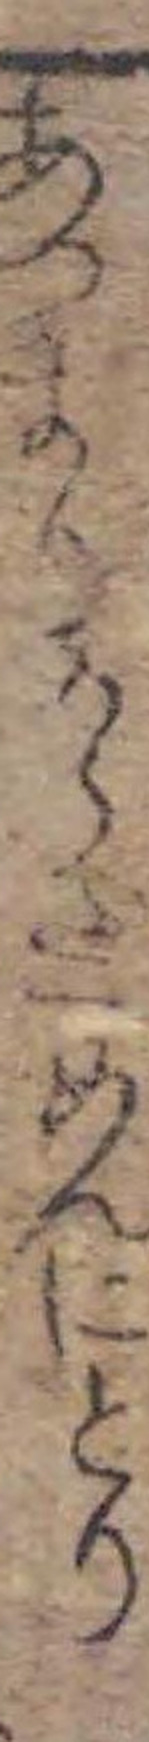あつまりからだ一めんにとり
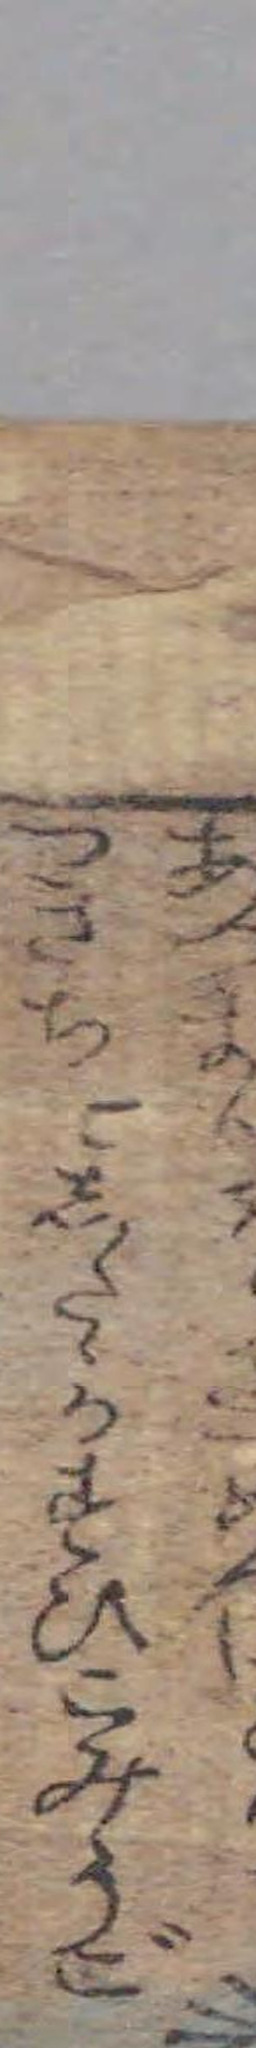つきちをしたゝかすひこみうご
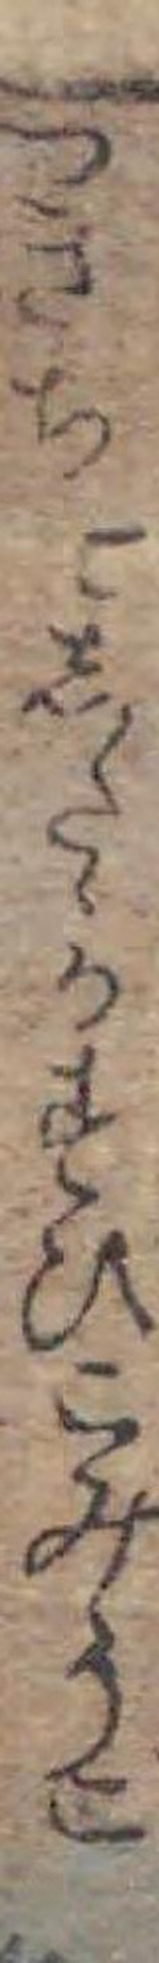つきちをしたゝかすひこみうご
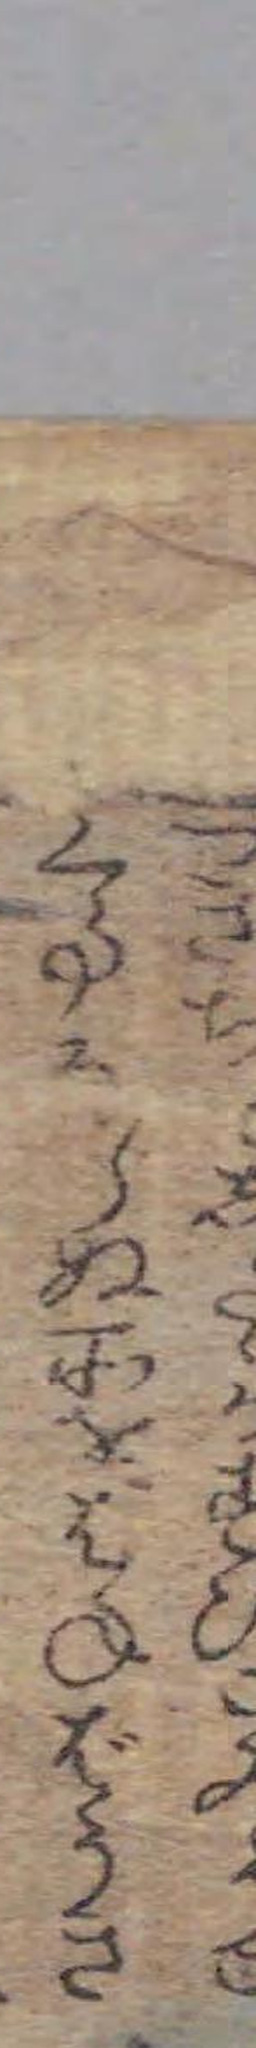く事ならぬ所をはねぼうき
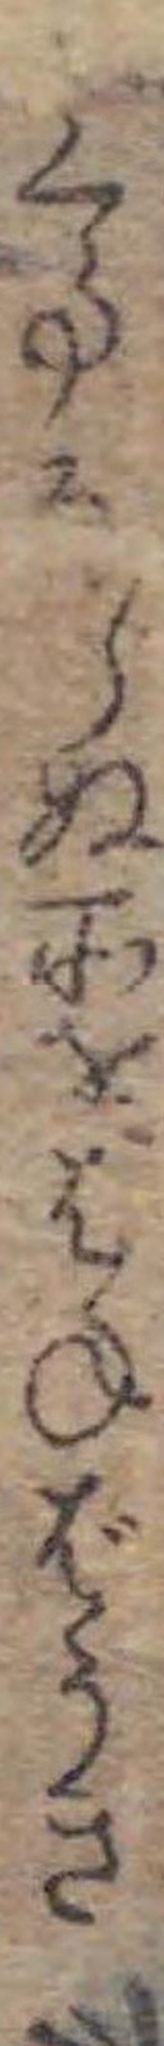く事ならぬ所をはねぼうき
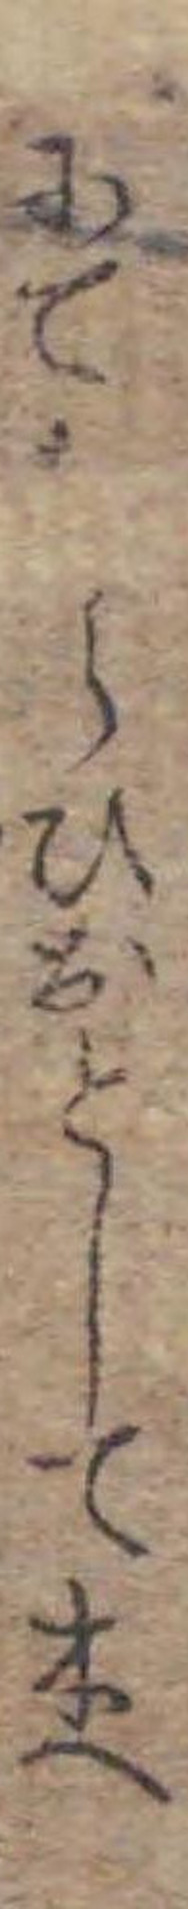にてはらひおとして木へ
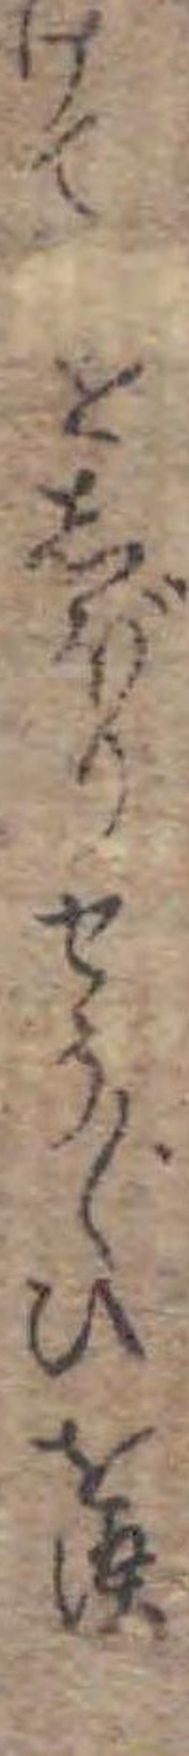けてをしぼりせう〴〵ひを染
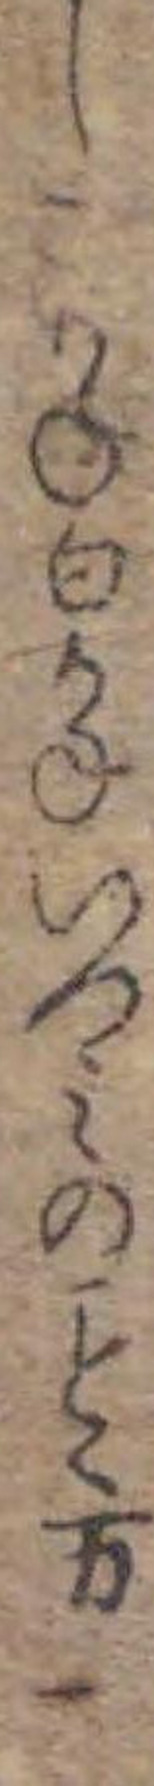しこかね白かねいつみのことく万
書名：虚言八百万八伝 : 3巻
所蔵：国立国会図書館 National Diet Library, JAPAN
